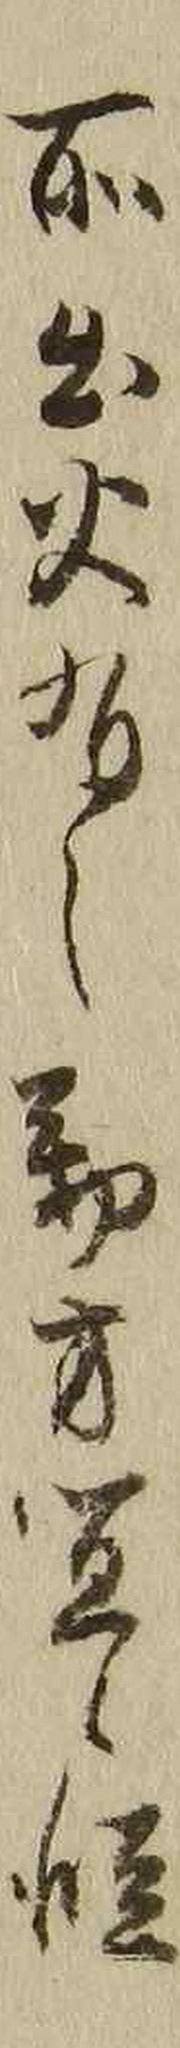所出火有之勤方宜候段
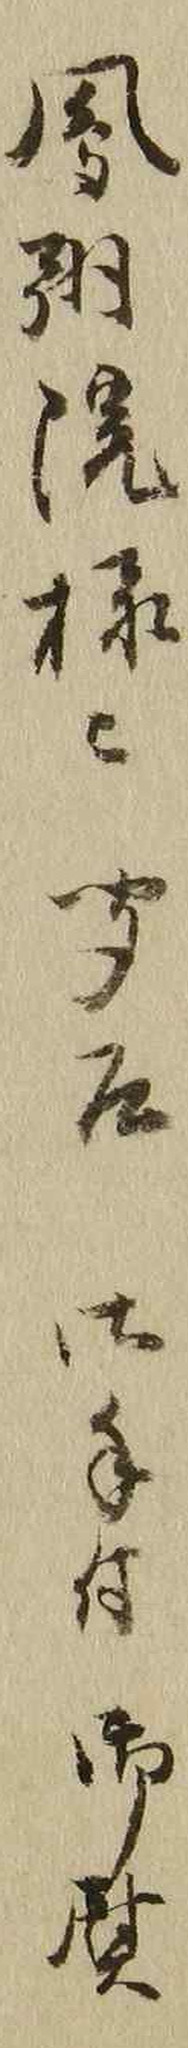鳳翔院様被聞召御手付御熨
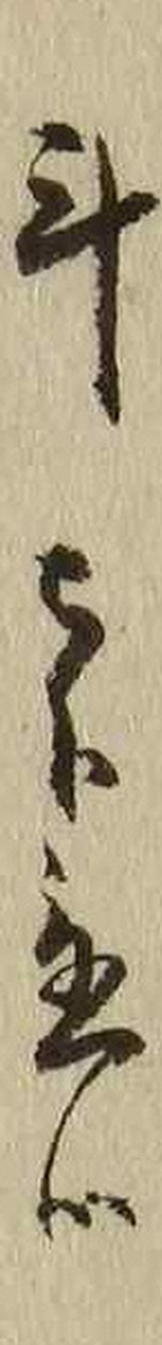斗被下置候
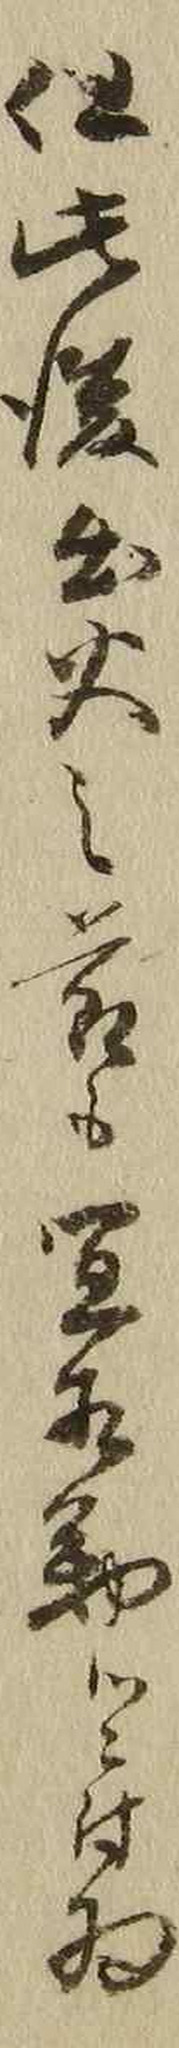但此後出火之節も宜相勤候ニ付為
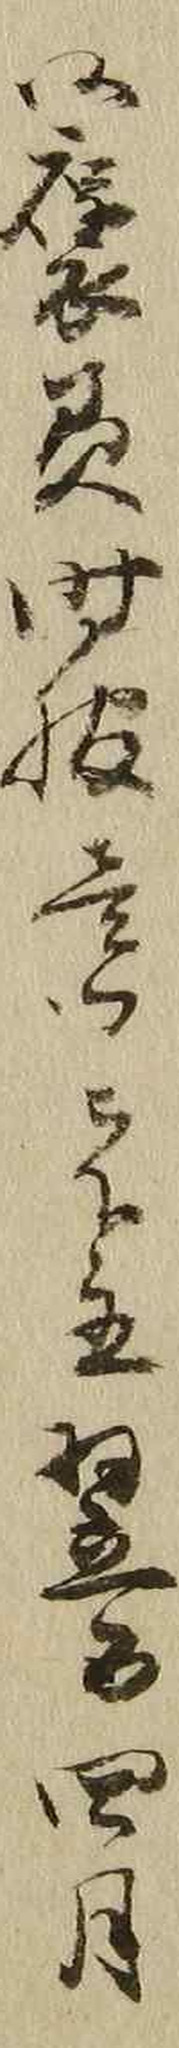御褒美時服壱ツ被下置翌酉四月
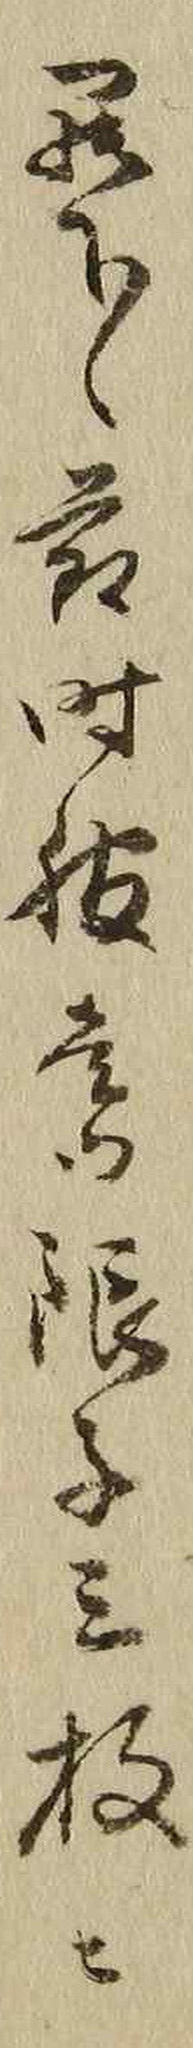罷下候節時服壱ツ銀子三枚被
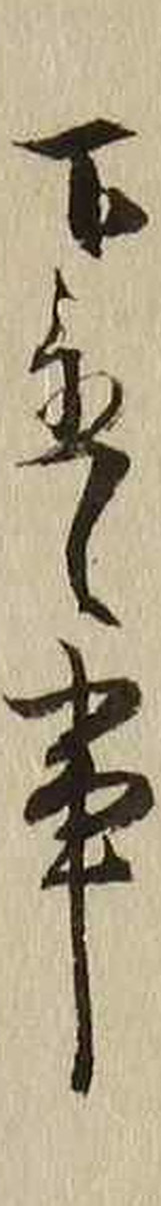下置候事
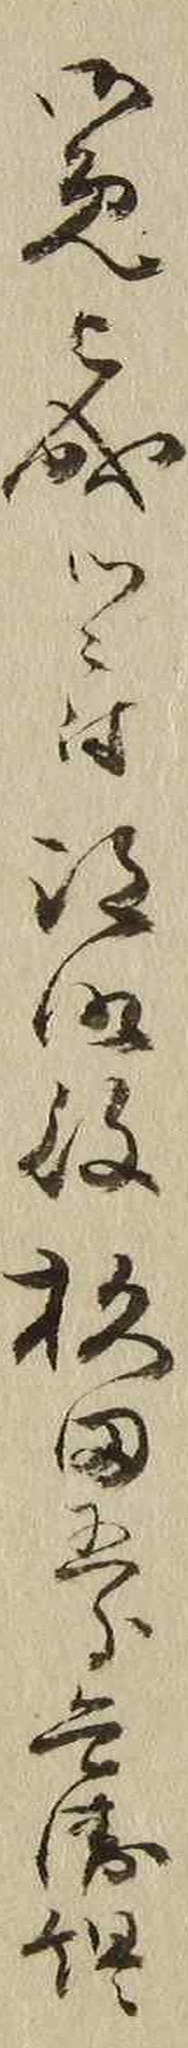御免被成候ニ付跡御役杉田五郎兵衛組ニ
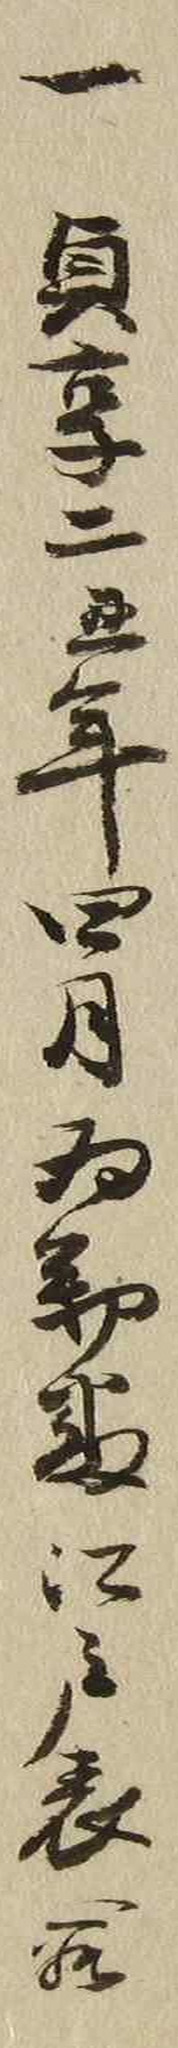一貞享二丑年四月為勤番江戸表へ罷
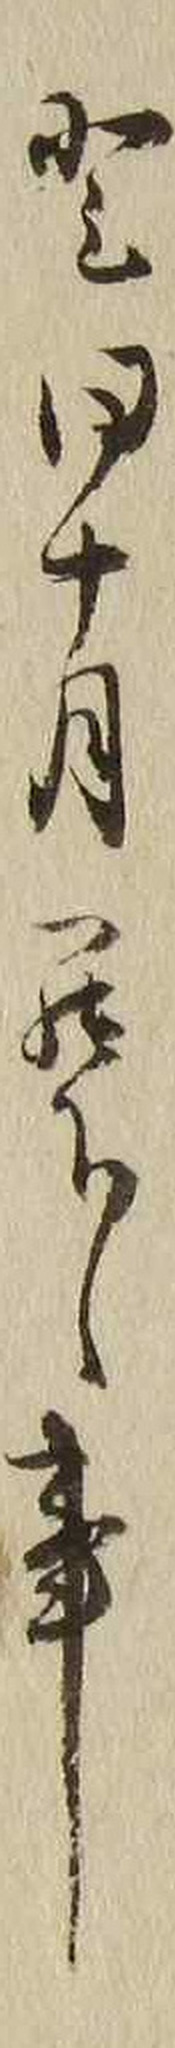登同十月罷下候事
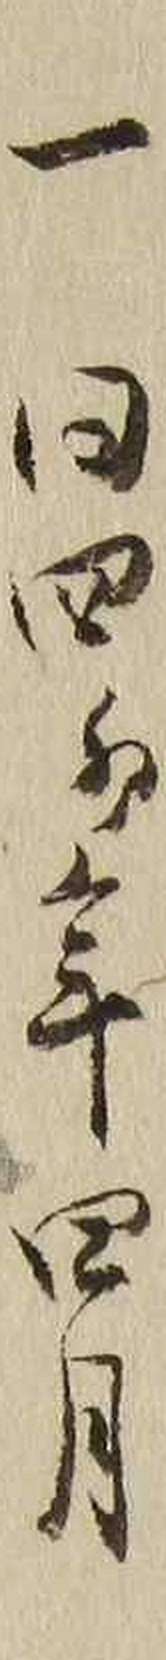一同四卯年四月
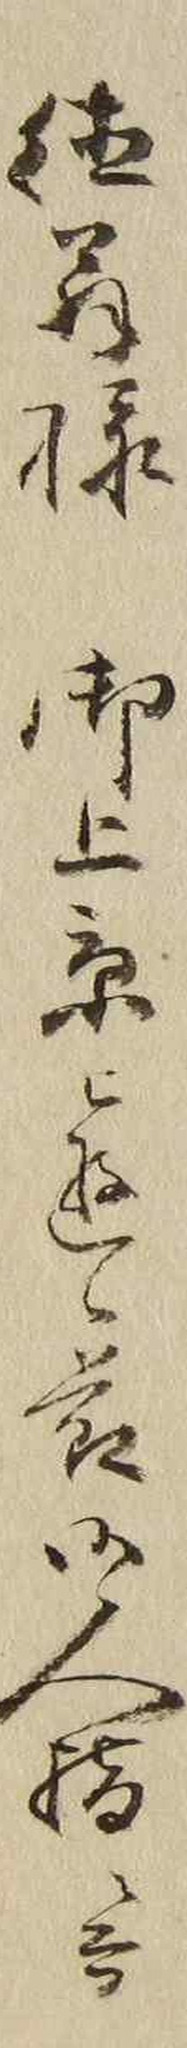徳翁様御上京被遊候節御人指ニ而
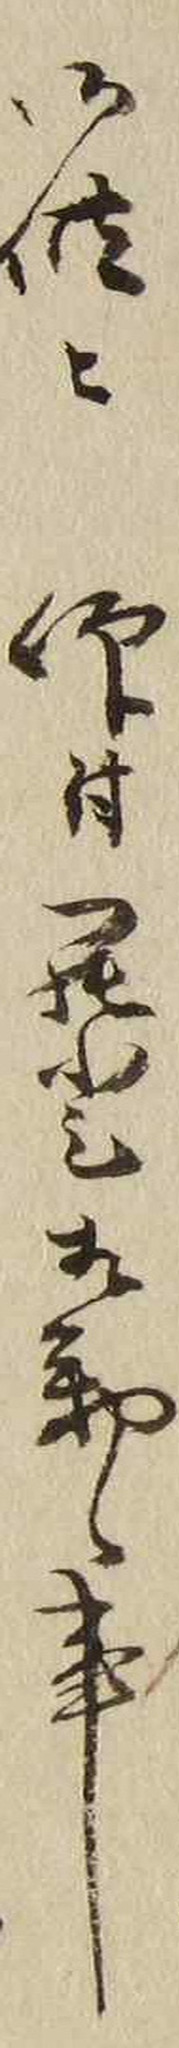御供被仰付罷登相勤候事

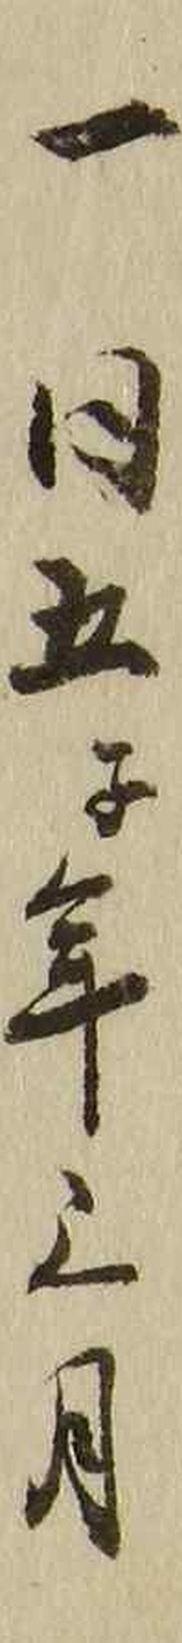一同五子年三月
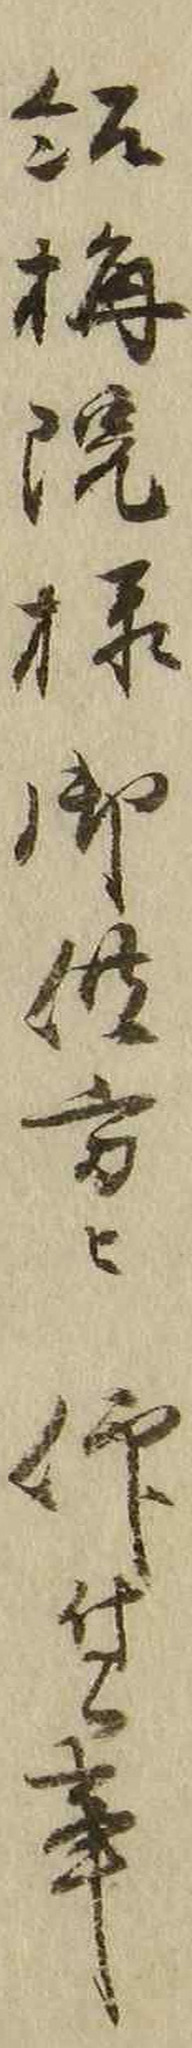紹栴院様御供方被仰付候事
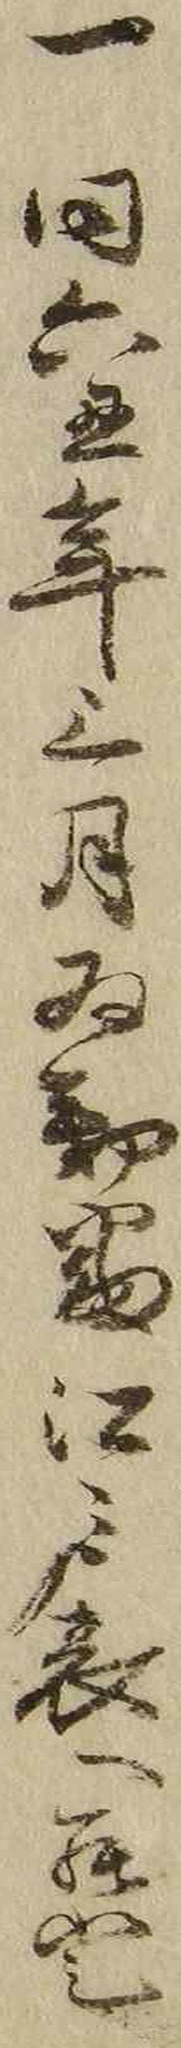一同六丑年三月為勤番江戸表へ罷登
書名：諸士系譜　巻之232　け之部1
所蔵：会津若松市立会津図書館
